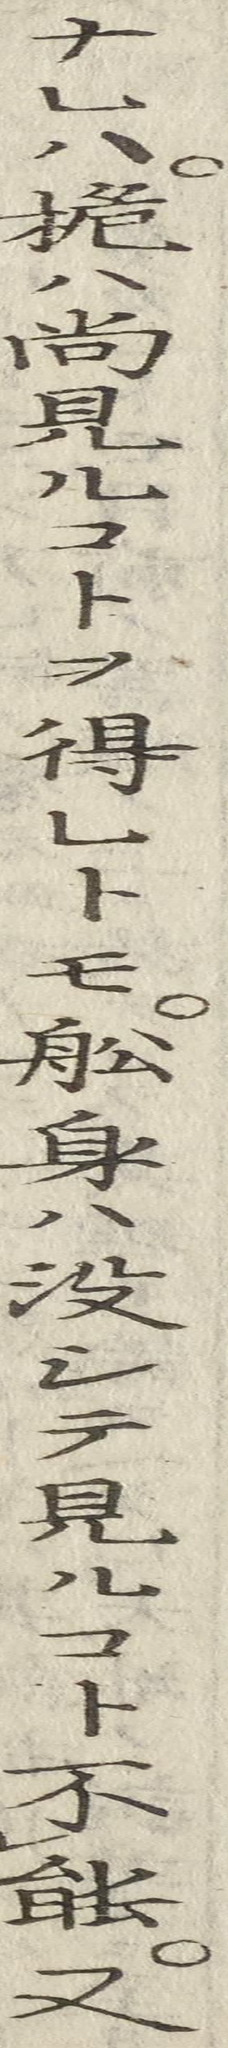ナレハ。桅ハ尚見ルコトヲ得レトモ。舩身ハ没シテ見ルコト不能。又
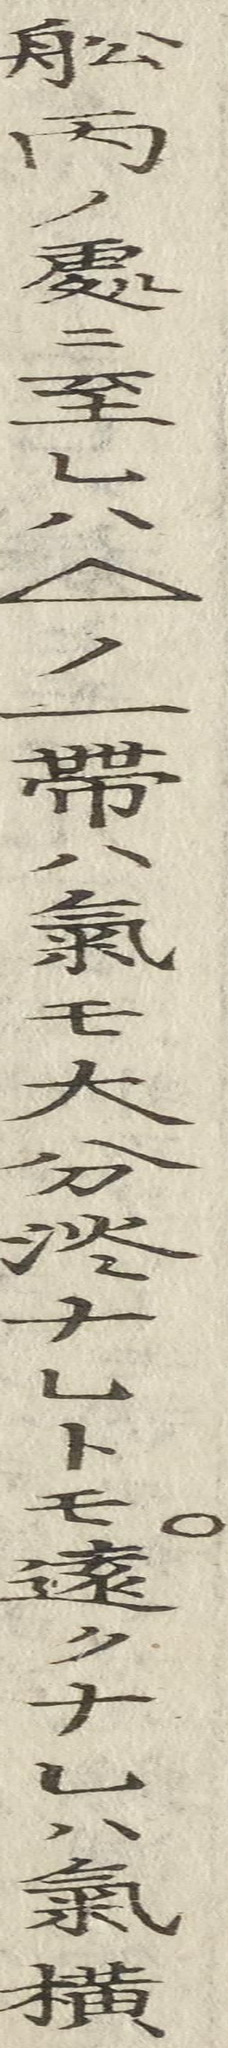舩丙ノ処ニ至レハ△ノ一帯ハ気モ大分淡ナレトモ。遠クナレハ気横
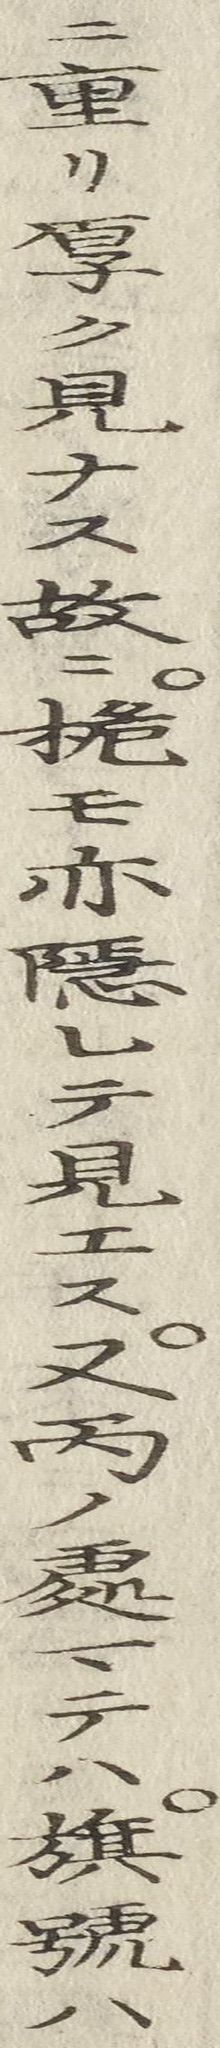ニ重リ厚ク見ナス故ニ。桅モ亦隠レテ見エス。又丙ノ処マテハ。旗号ハ
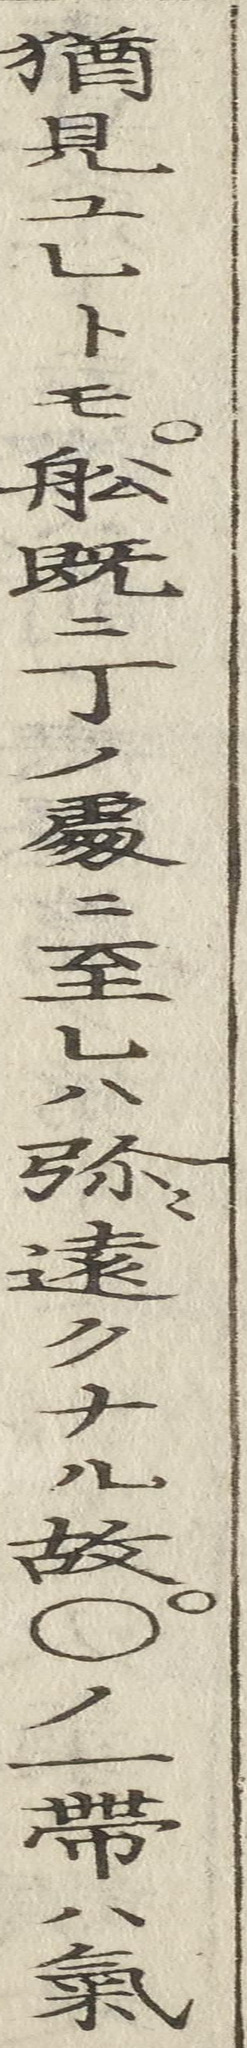猶見ユレトモ。舩既ニ丁ノ処ニ至レハ弥々遠クナル故。○ノ一帯ハ気
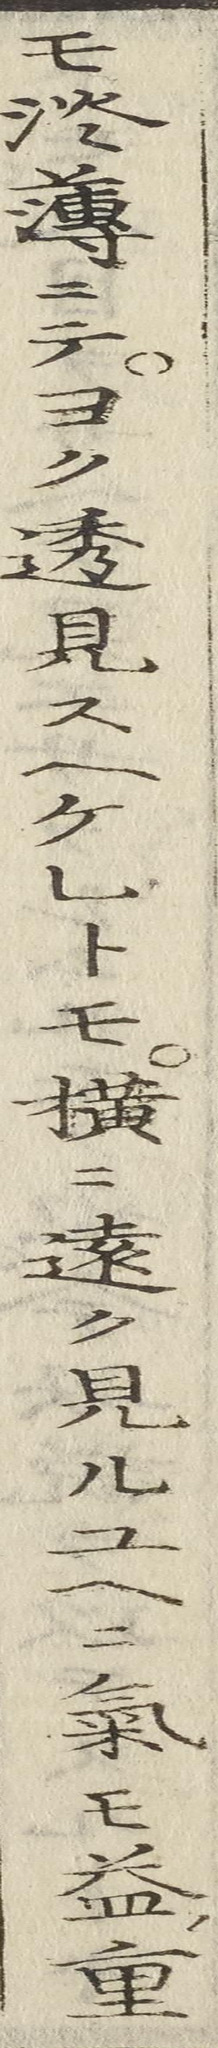モ淡薄ニテ。ヨク透見スヘケレトモ。横ニ遠ク見ルユヘニ気モ益々重
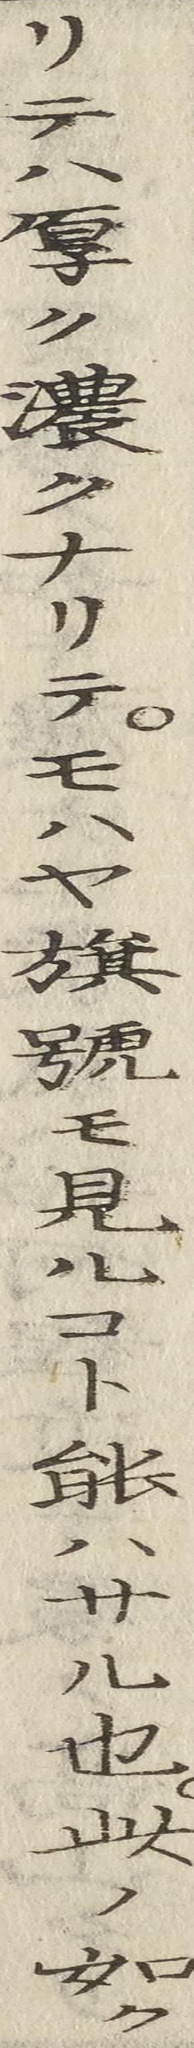リテハ厚ク濃クナリテ。モハヤ旗号モ見ルコト能ハサル也。此ノ如ク
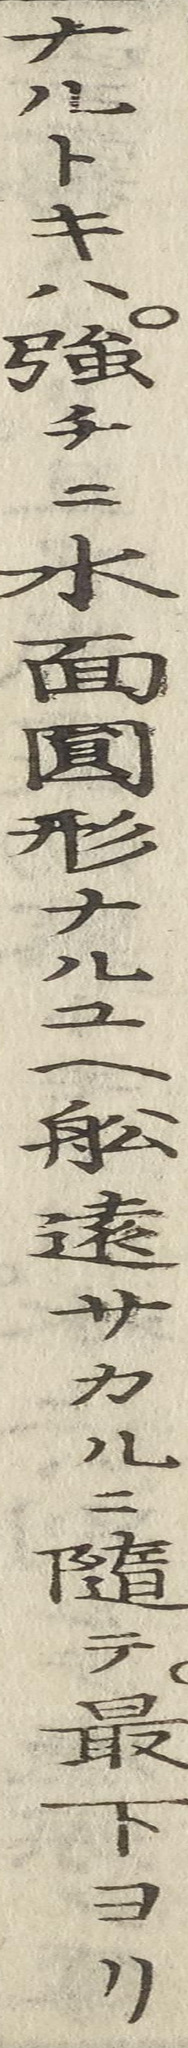ナルトキハ。強チニ水面円形ナルユヘ舩遠サカルニ随テ。最下ヨリ
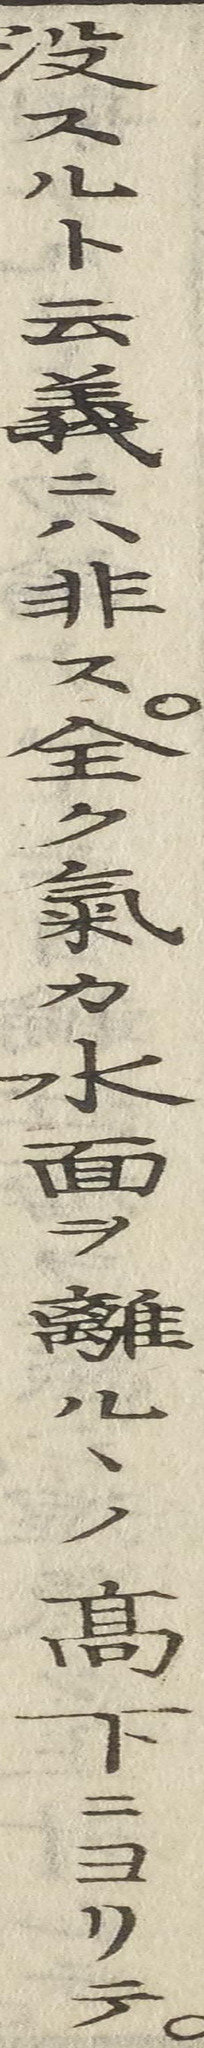没スルト云義ニハ非ス。全ク気カ水面ヲ離ルヽノ髙下ニヨリテ。
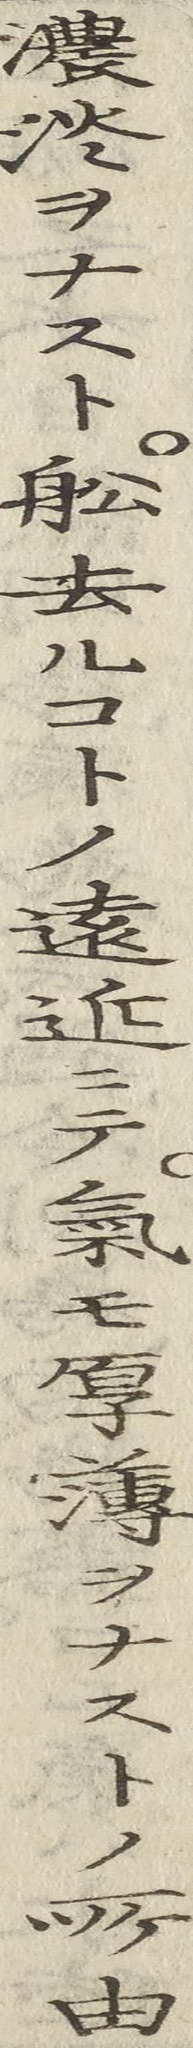濃淡ヲナスト。舩去ルコトノ遠近ニテ。気モ厚薄ヲナストノ所由
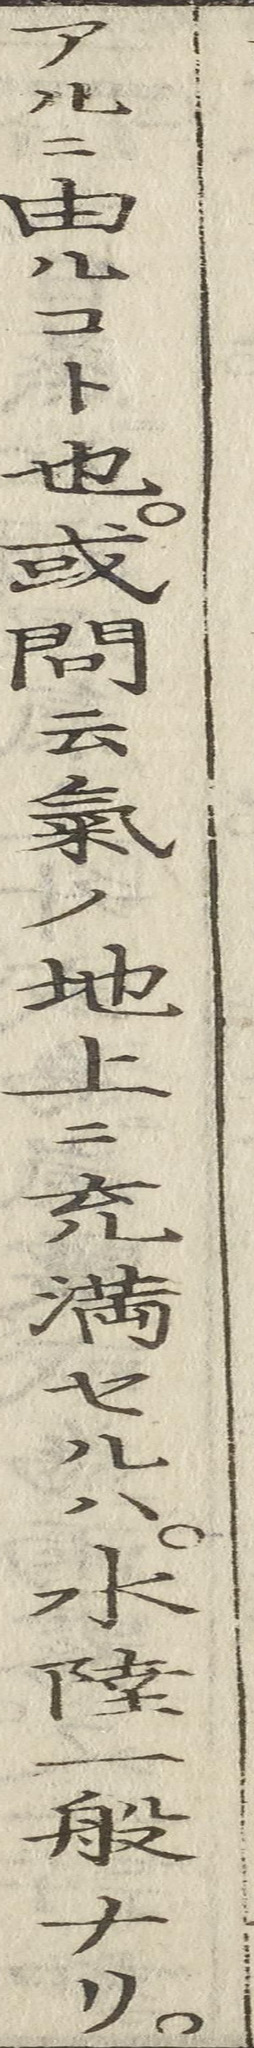アルニ由ルコト也。或問云気ノ地上ニ充満セルハ。水陸一般ナリ。
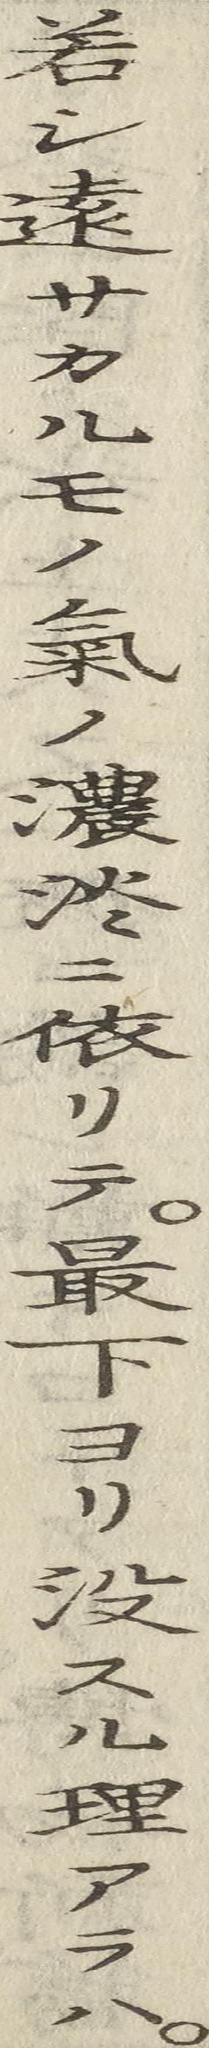若シ遠サカルモノ気ノ濃淡ニ依リテ。最下ヨリ没スル理アラハ。
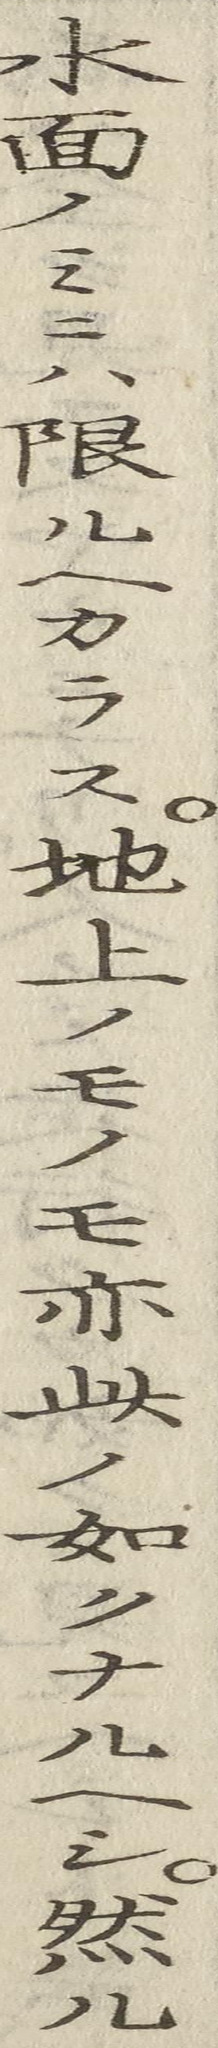水面ノミニハ限ルヘカラス。地上ノモノモ亦此ノ如クナルヘシ。然ル
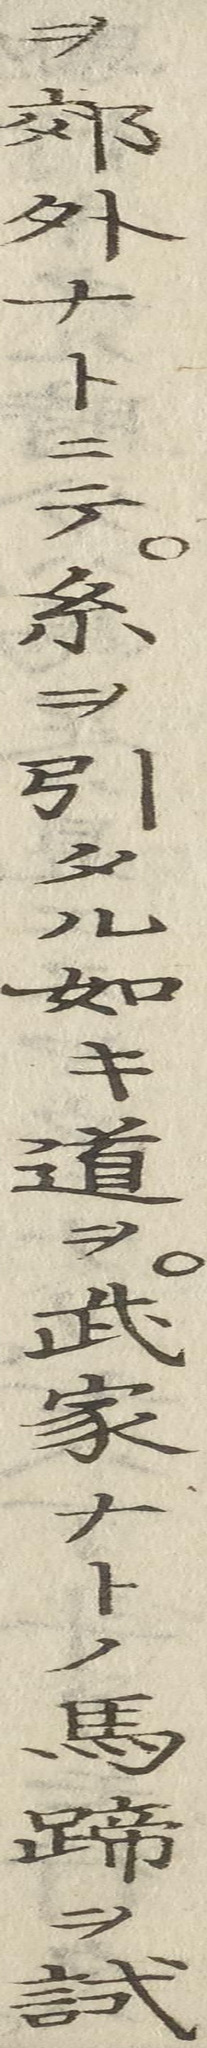ヲ郊外ナトニテ。糸ヲ引タル如キ道ヲ。武家ナトノ馬蹄ヲ試
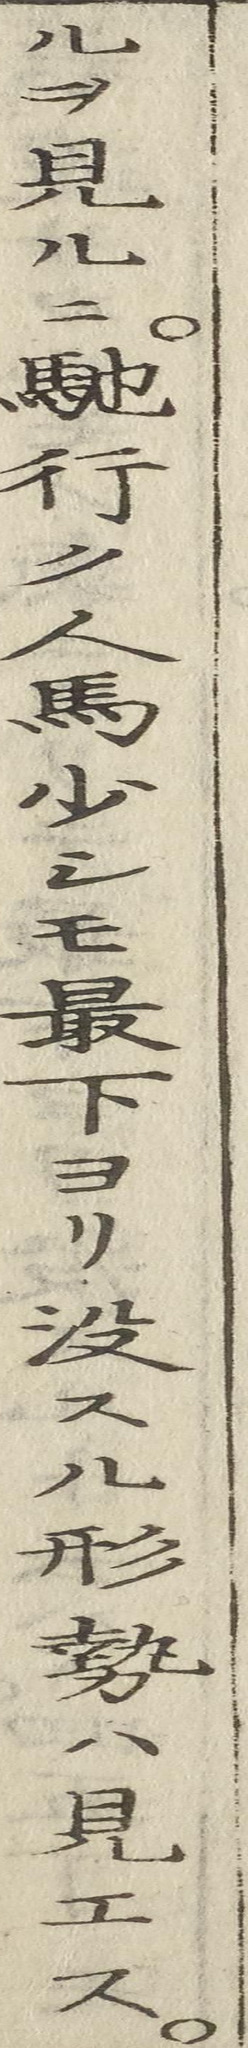ルヲ見ルニ。馳行ク人馬少シモ最下ヨリ没スル形勢ハ見エス。

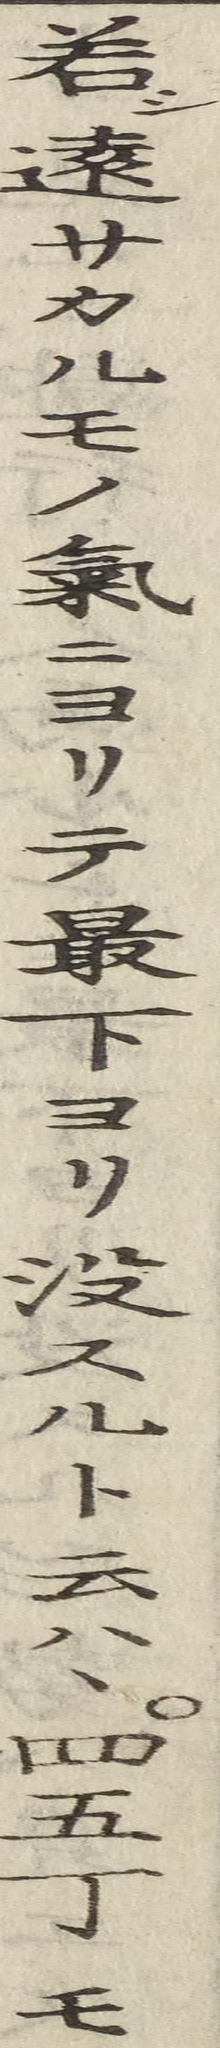若シ遠サカルモノ気ニヨリテ最下ヨリ没スルト云ハヽ。四五丁モ
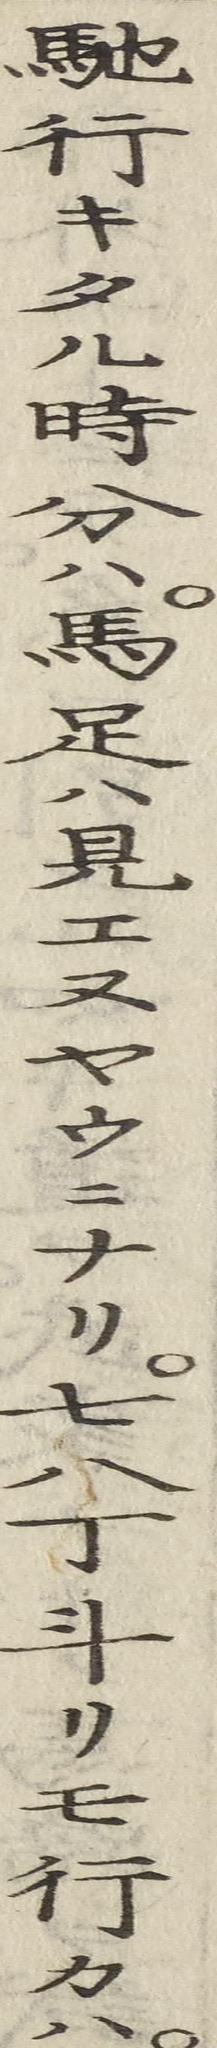馳行キタル時分ハ。馬足ハ見エヌヤウニナリ。七八丁斗リモ行カハ。
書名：護法新論　中
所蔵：東京大学地震研究所図書室 Earthquake Research Institute Library, The University of Tokyo, JAPAN
